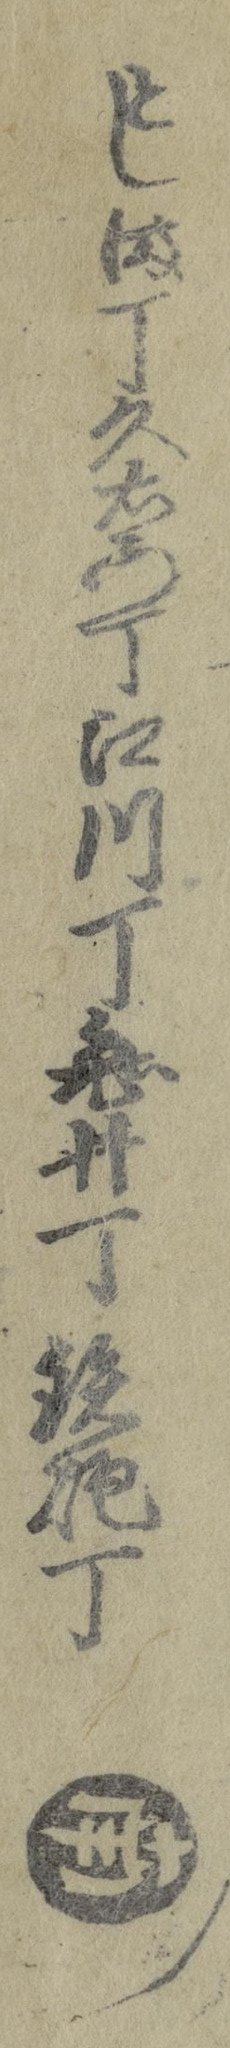としま丁久右衛門丁江川丁亀井丁鉄炮丁
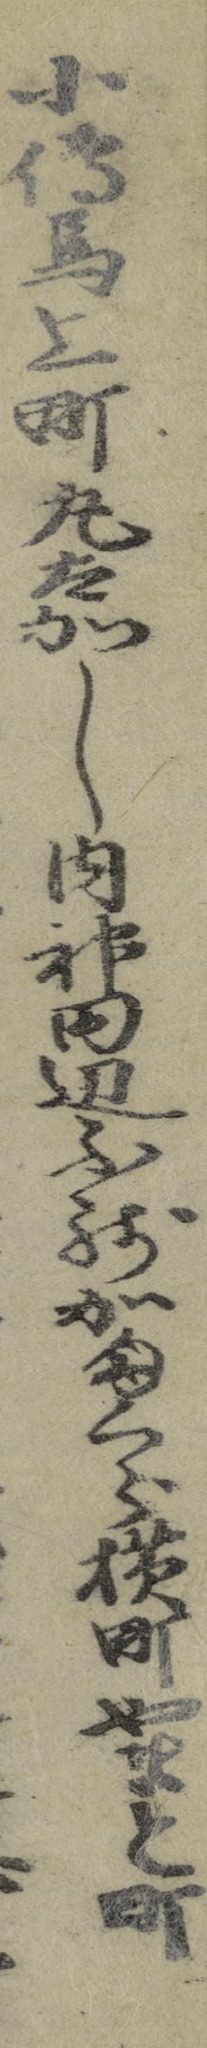小伝馬上町丸たかし内神田辺不残かまくら横町やまと町
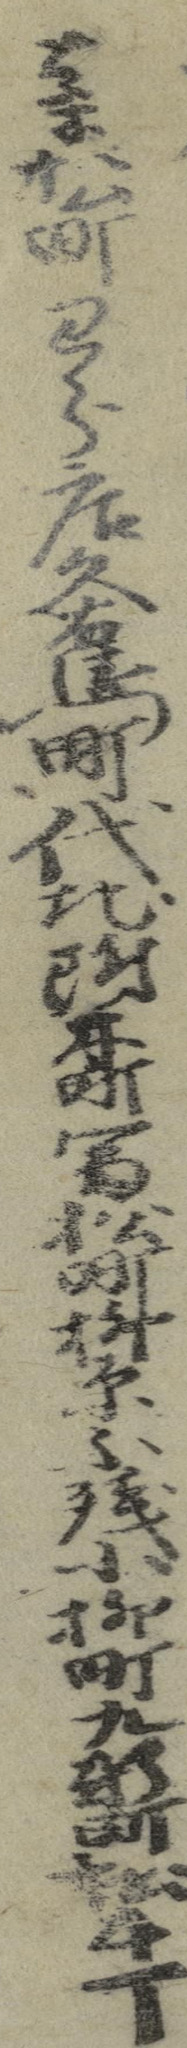はま松町わら店久右衛門町代地附木町富松町柳原不残小柳町九軒町松平町
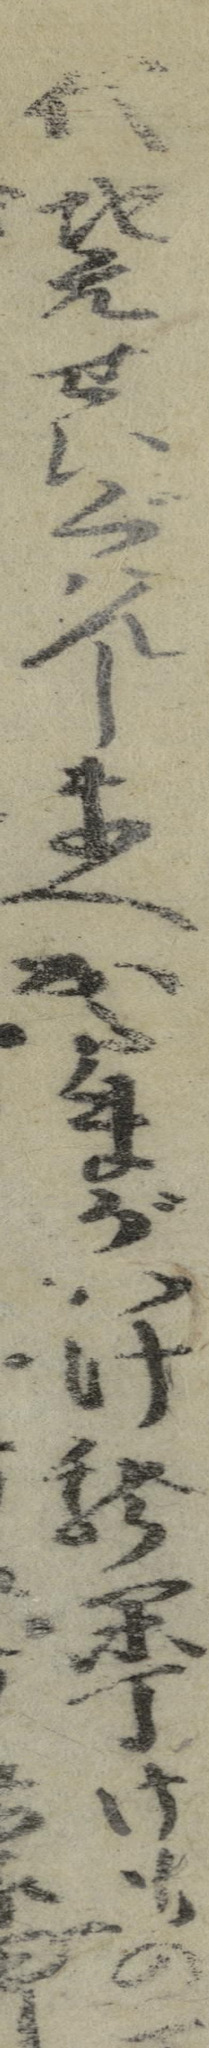代地元せいぐはんしまへおたまがいけ龍閑丁丁けもの丁
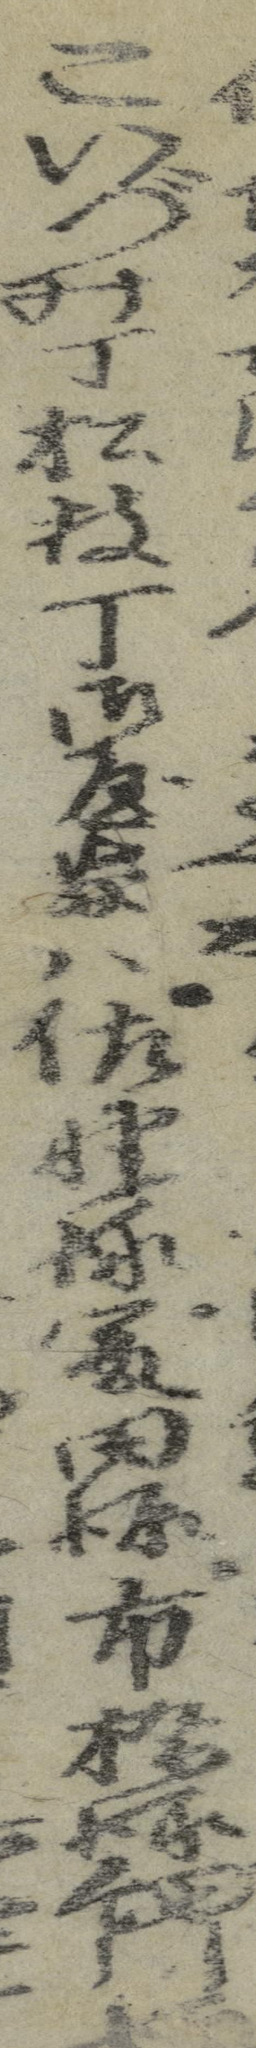こいづみ丁松枝丁御屋敷は●佐野様●冨田様●市橋様●細川様
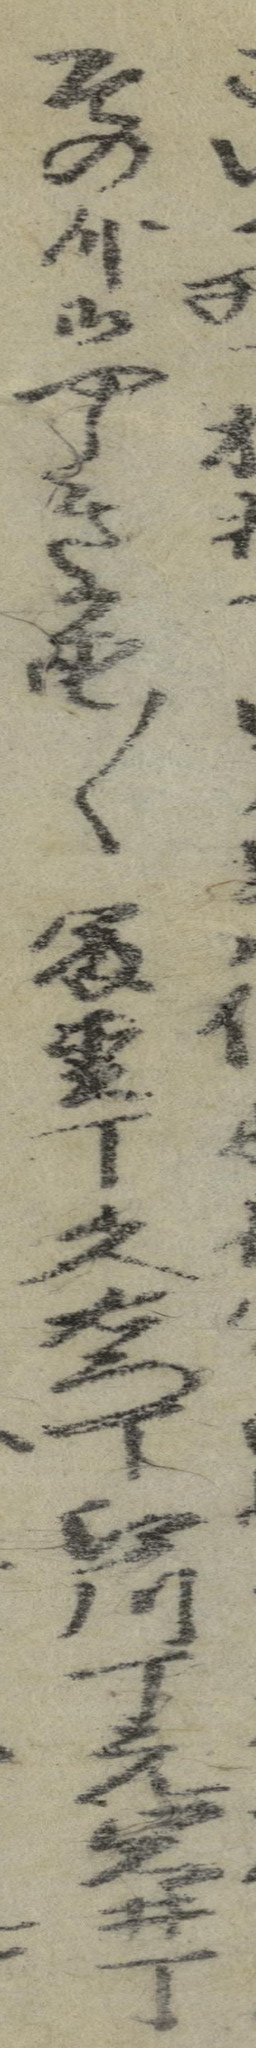その外御やしきかす〳〵冨松丁久右衛門町江川丁元岩井丁
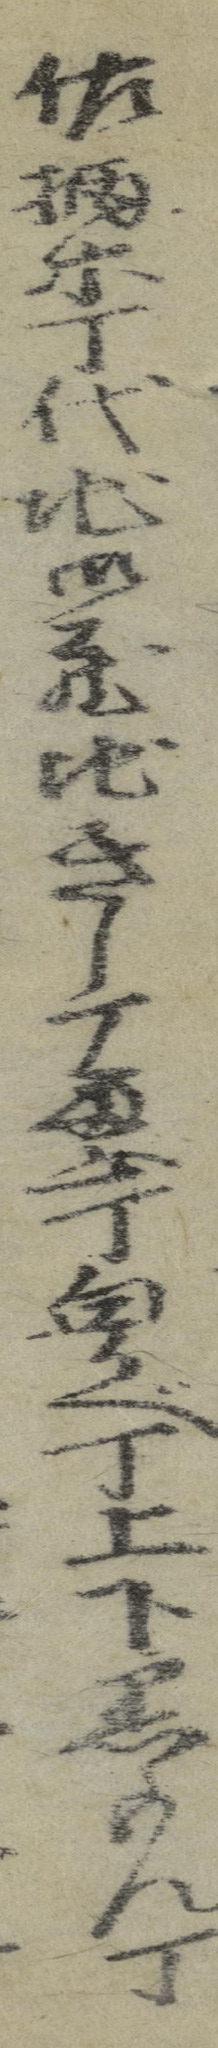佐柄木町代地御蔵地きし丁通石丁白かべ丁上下黒もん丁
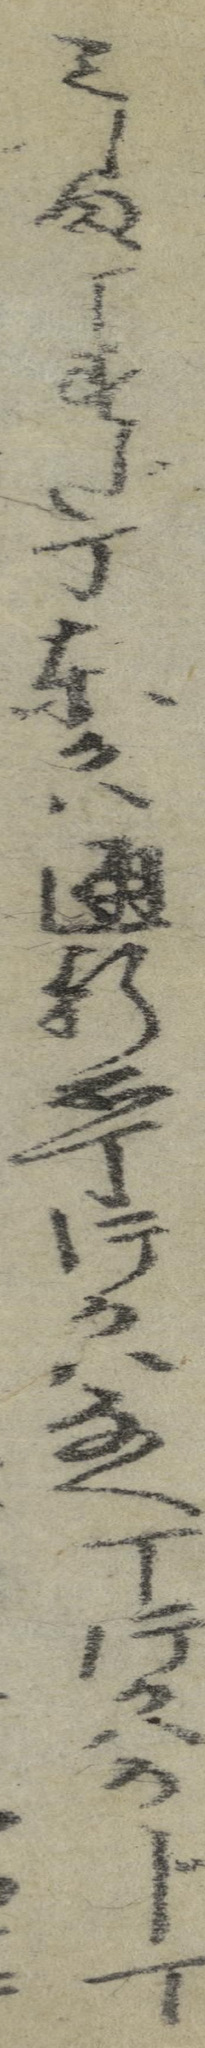みしま丁すだ丁本かは通新石丁片かはなへ丁片かはかじ丁
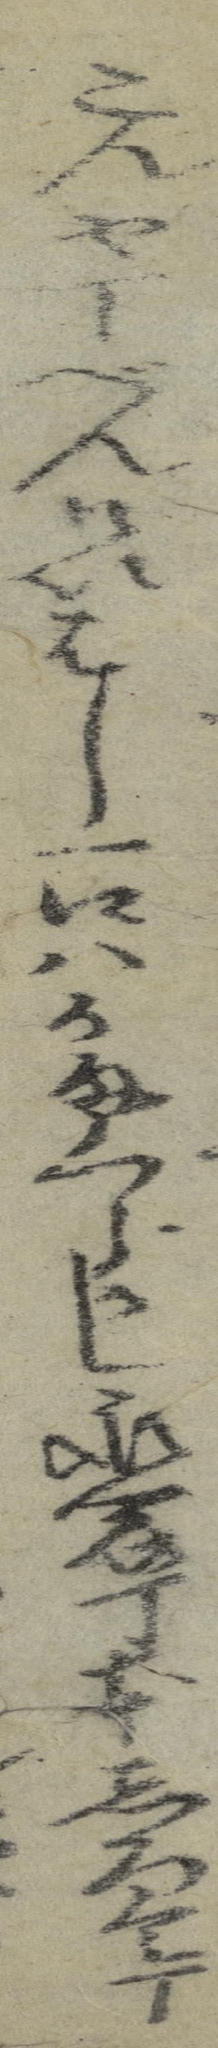こんや丁げんけいはし一口はかまくらかし永富丁本しろくみ丁
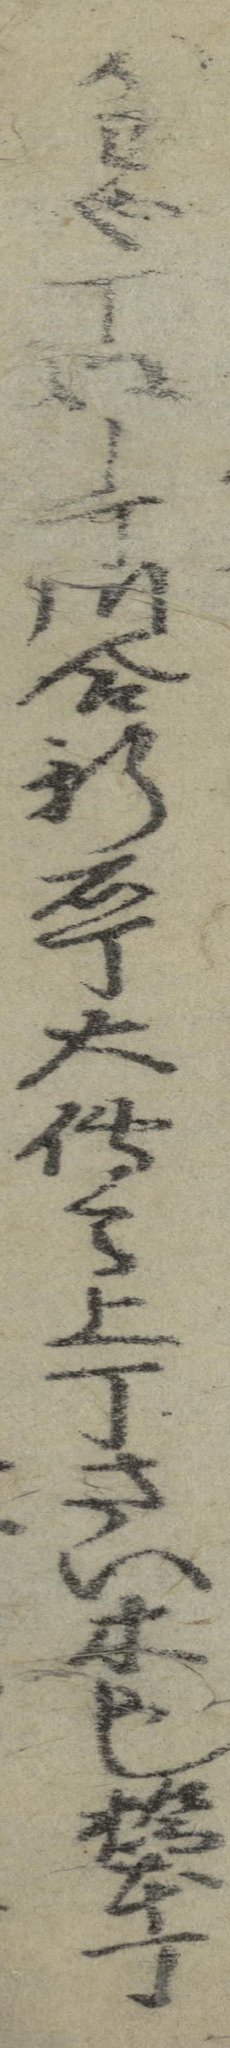かわや丁ぬし丁川合新石丁大伝馬上丁さい木かし橋本丁
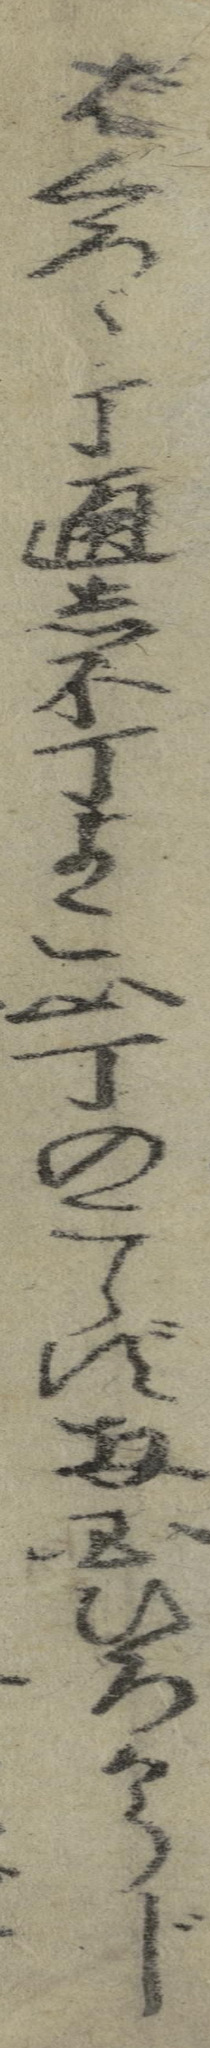ばくろ丁通しほ丁よこ山丁のこらず両国ひろかうじ
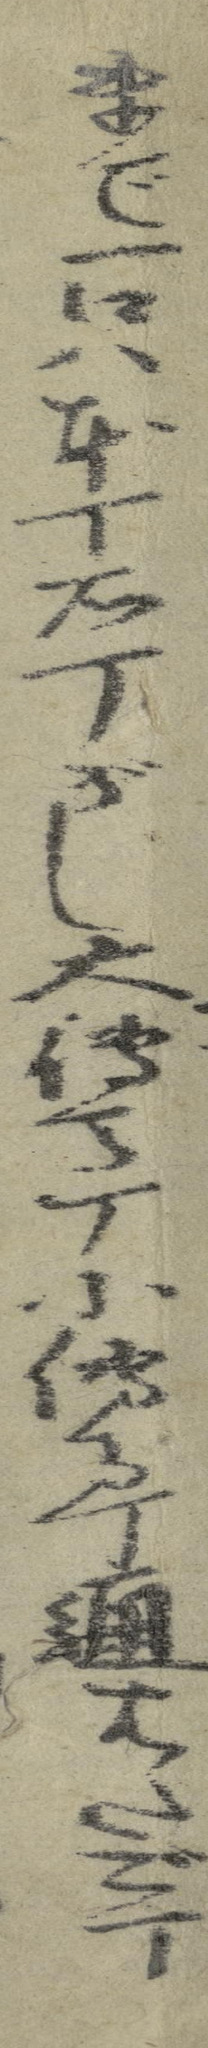まで一口は本丁石丁がし大電場丁小伝馬丁通はたご丁
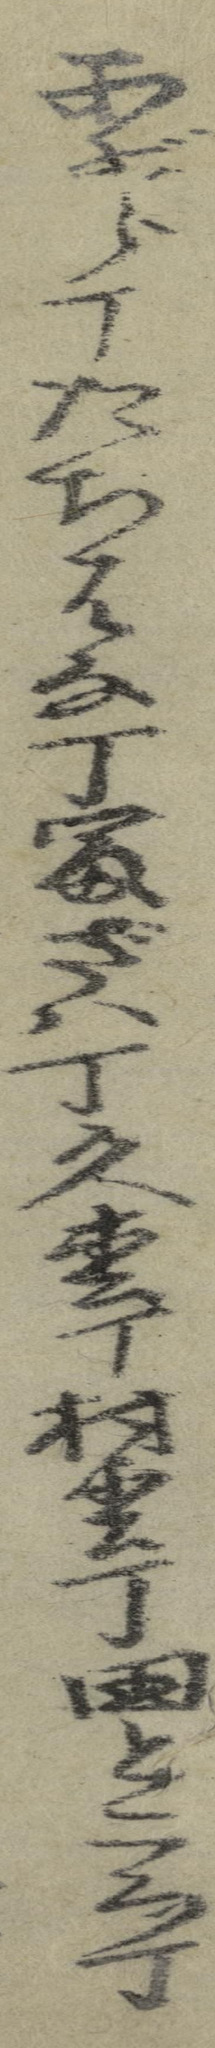あぶら丁たちはな丁富ざは丁久松丁村松丁田ところ丁
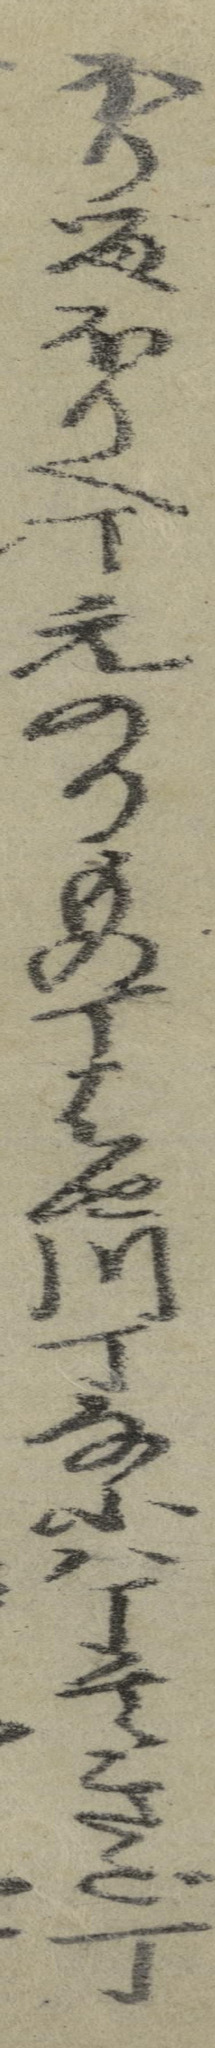ほり留ほりへ丁元のりもの丁はせ川丁なには丁はたご丁
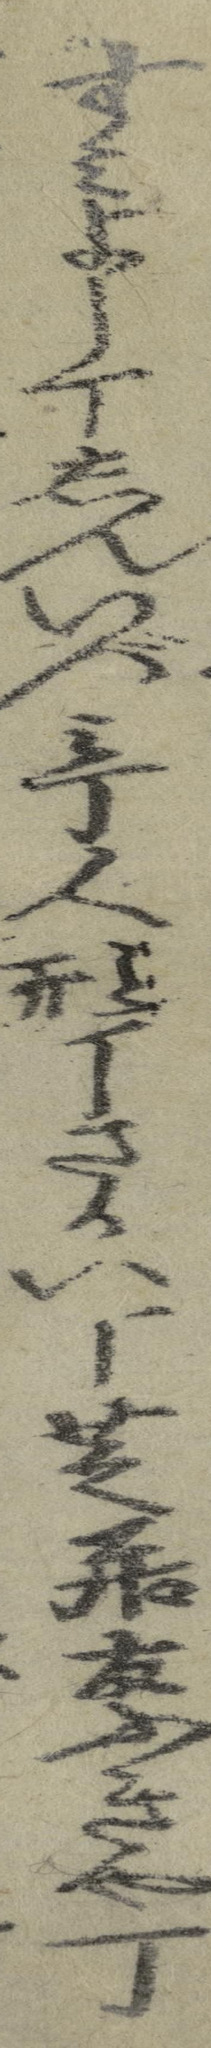すみよし丁しんいはみ丁人形丁さかい丁芝居友ふきや丁
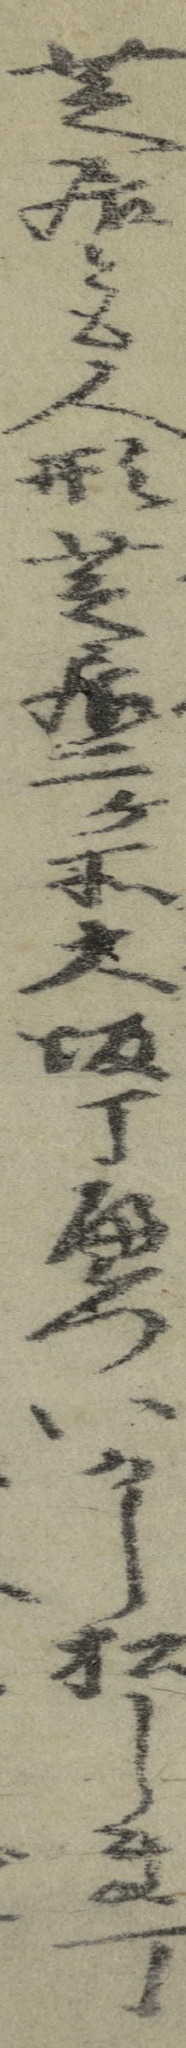芝居とも人形芝居二ヶ所大坂丁まついかし松しま丁
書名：方角場所附
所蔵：東京大学地震研究所図書室 Earthquake Research Institute Library, The University of Tokyo, JAPAN
